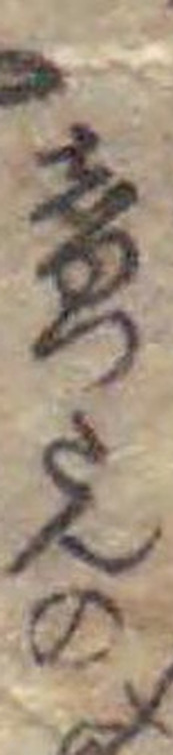しつたんの
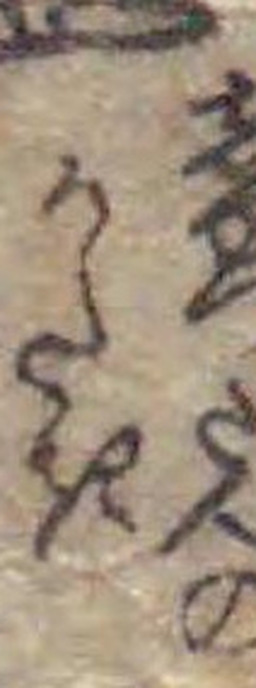かたき
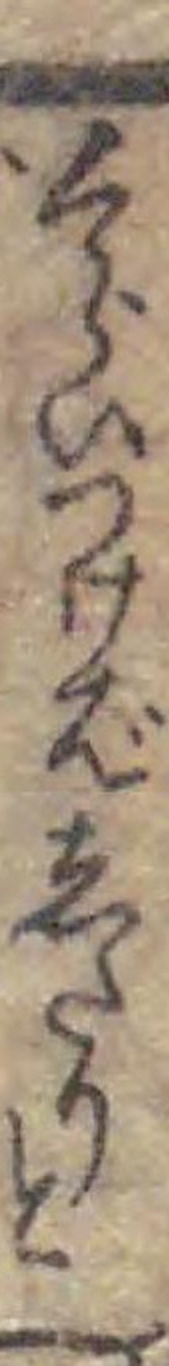くらいつけばしたりと
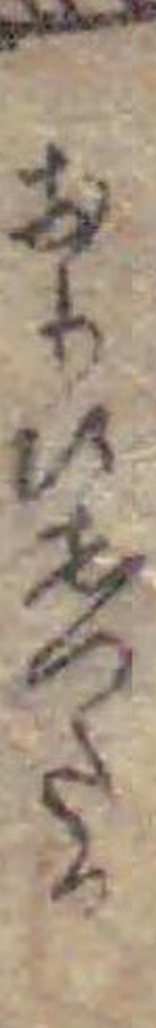おもいしつたか
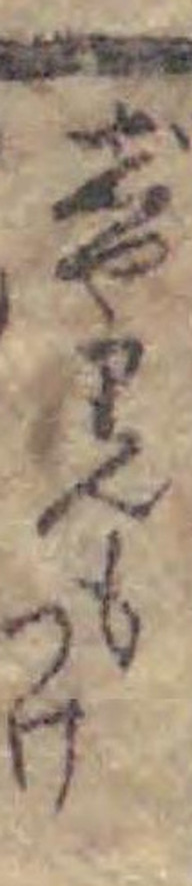じやりんもつけ
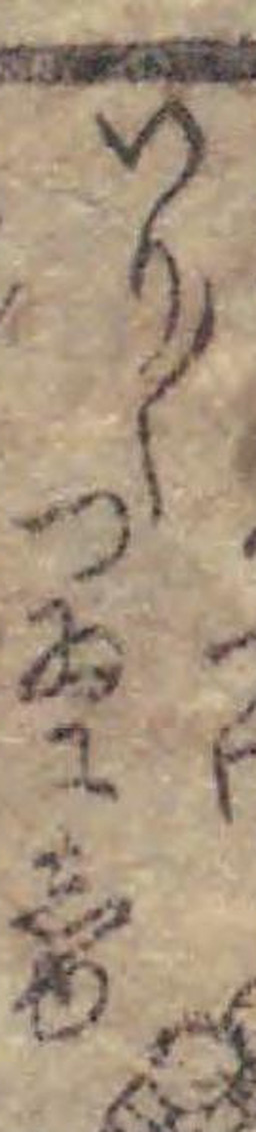いり〳〵つゐにしゆ
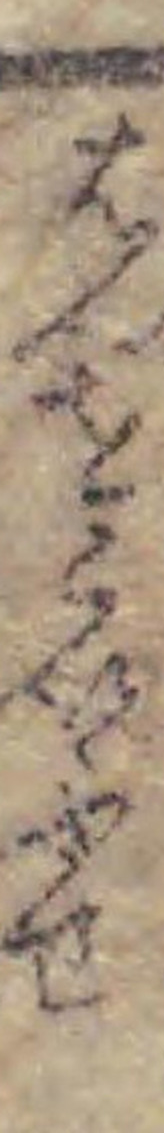はんをくいふせ
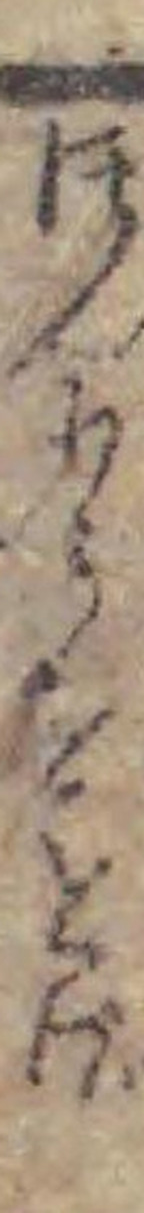ほんもうをとげ
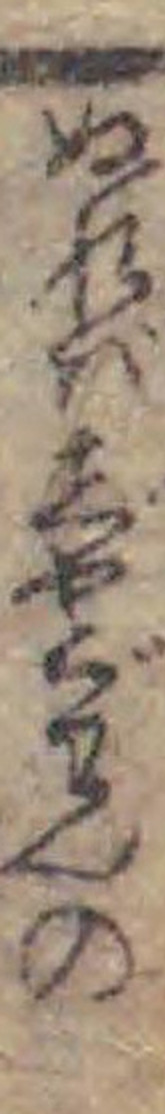ぬればじやぐわんの
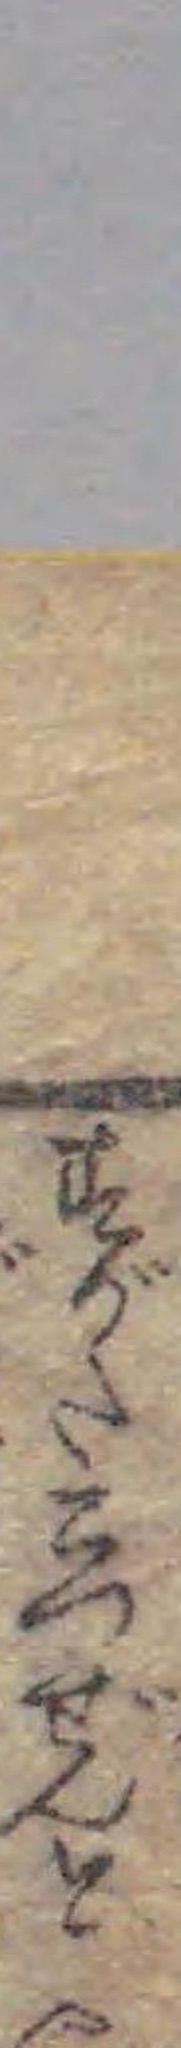すがたこつぜんと
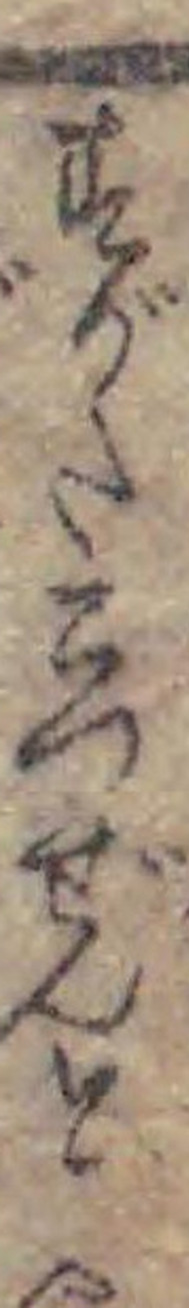すがたこつぜんと
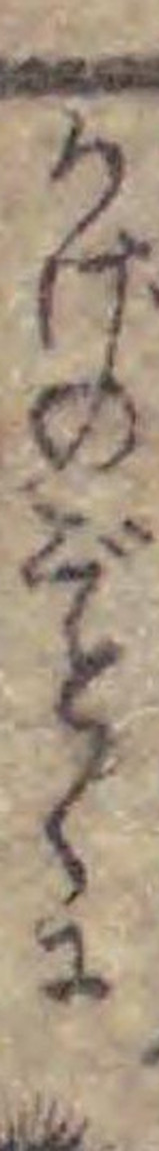かげのごとくに
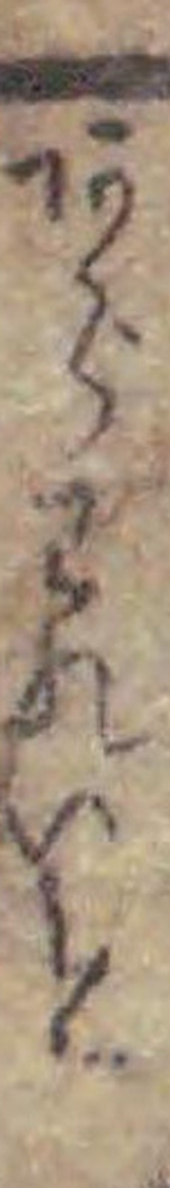あらわれいと
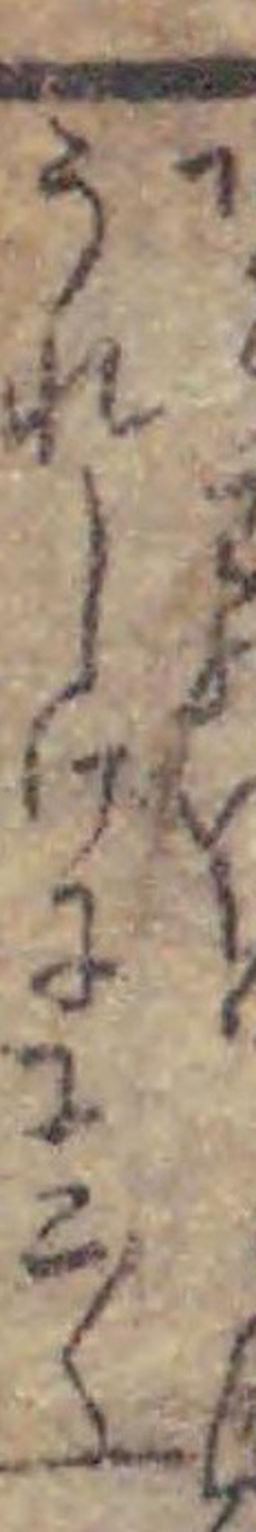うれしけににこ〳〵
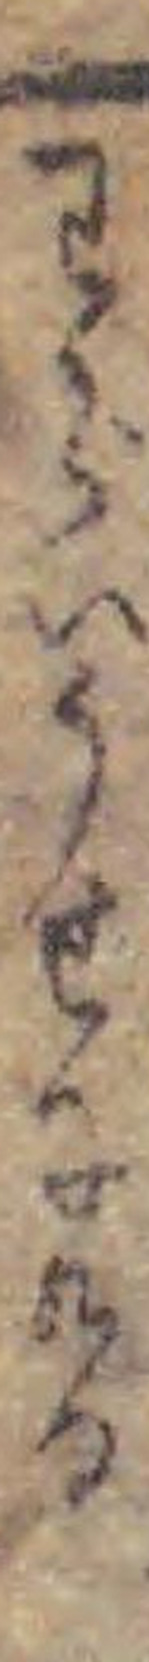わらいうせにける

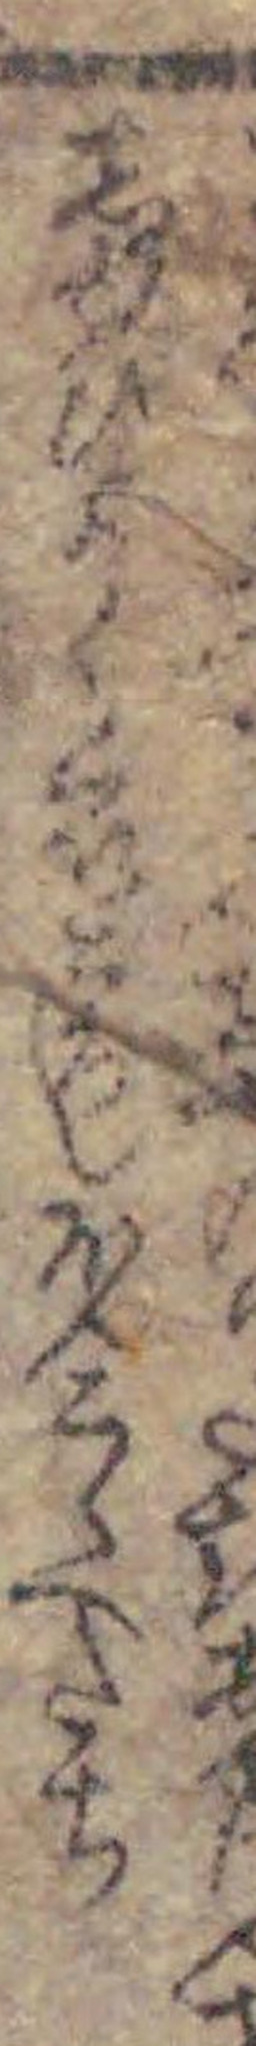しゆひよくくいころしほんこくへたち
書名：化物世界夜半嵐 : 3巻
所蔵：国立国会図書館 National Diet Library, JAPAN
